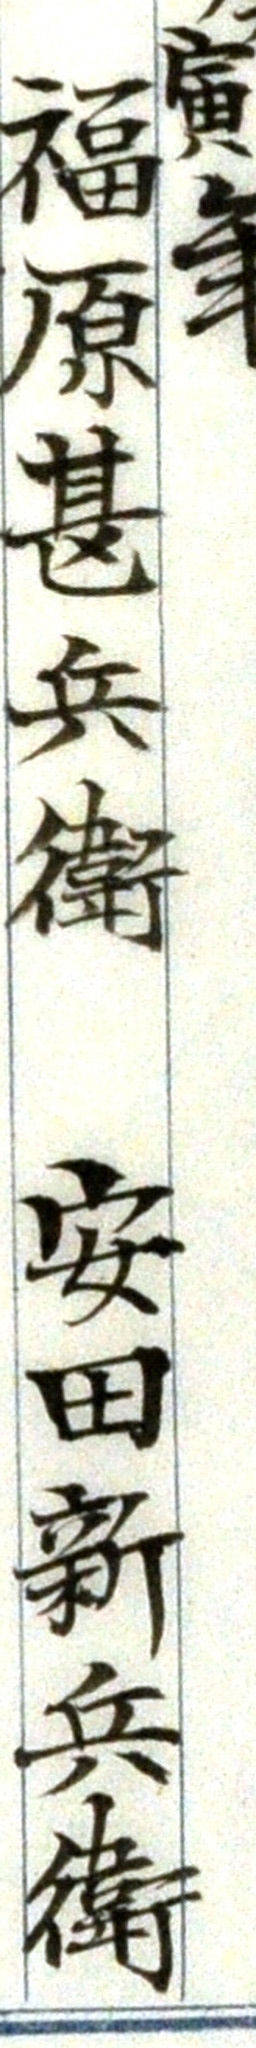福原甚兵衛安田新兵衛
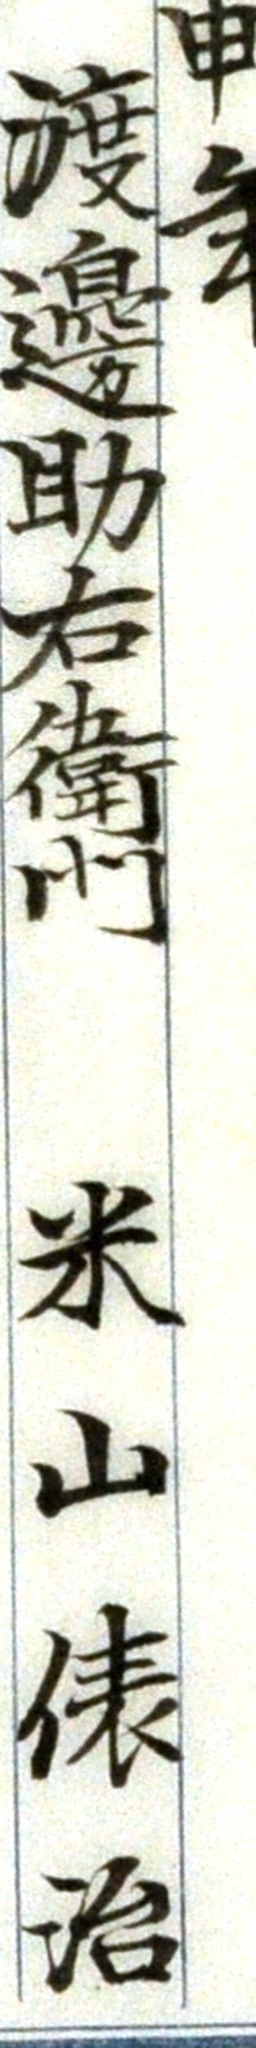渡邊助右衛門米山俵治
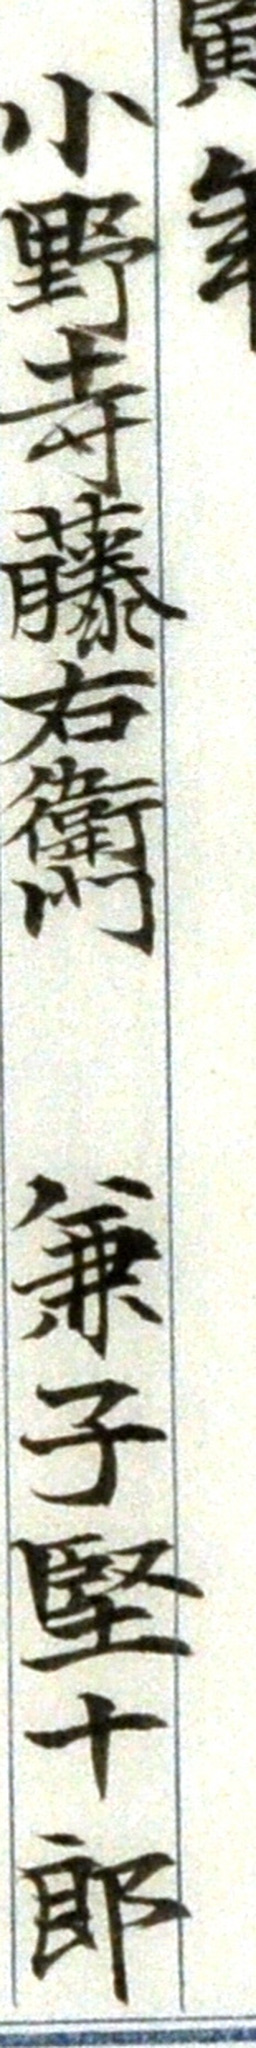小野寺藤右衛門兼子堅十郎
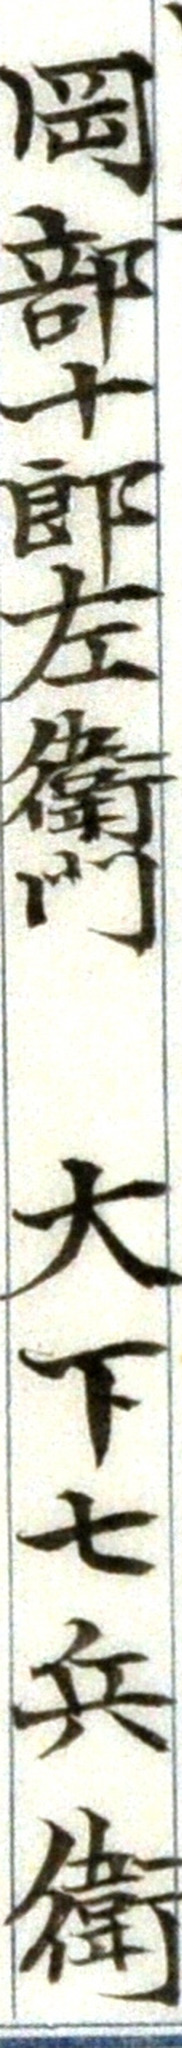岡部十郎左衛門大下七兵衛

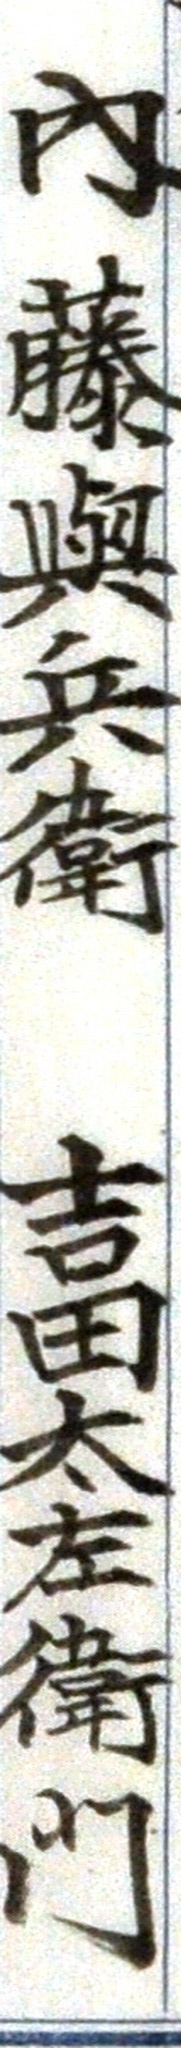内藤与兵衛吉田太左衛門
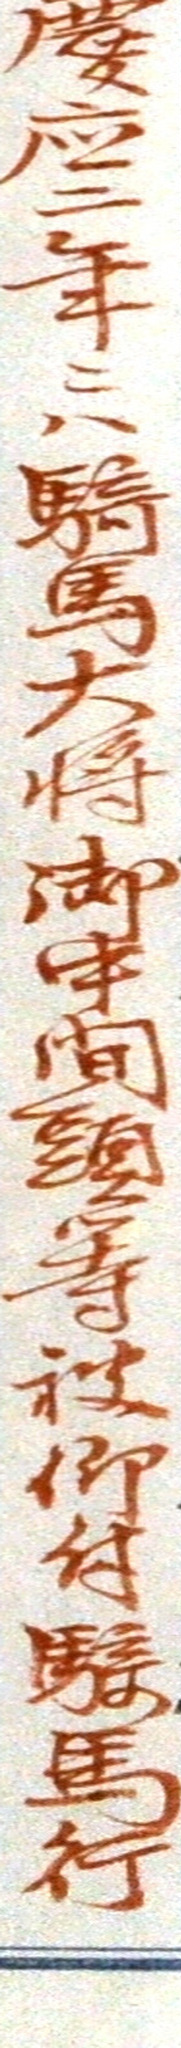慶応二年ニハ騎馬大将御中間頭等被仰付騎馬行
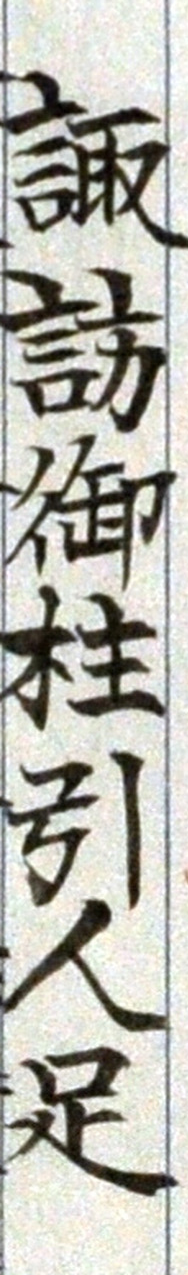諏訪御柱引人足
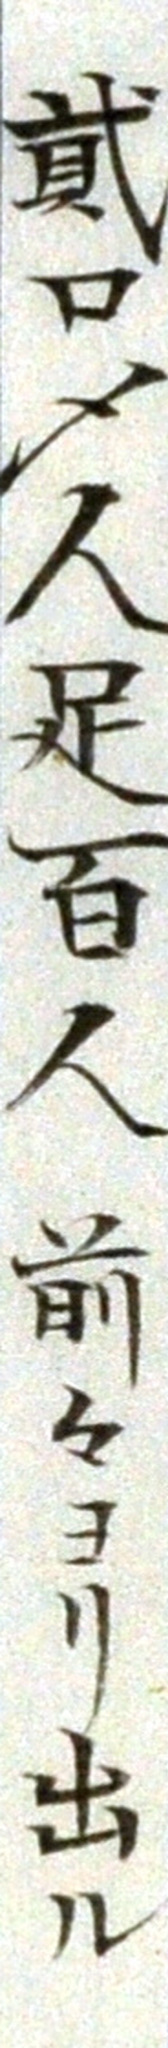弐口〆人足百人前々ヨリ出ル
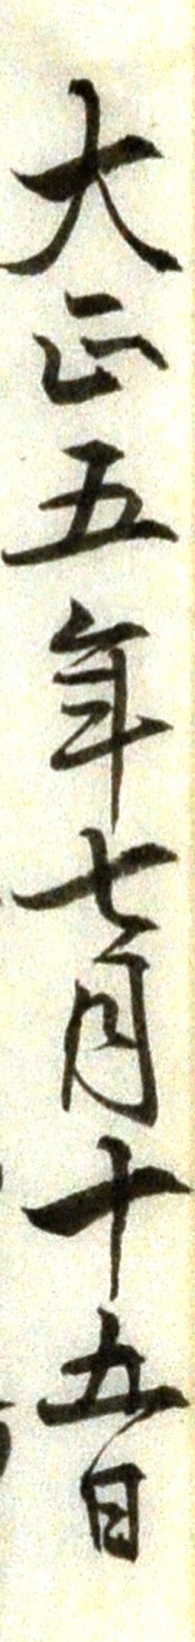大正五年七月十五日
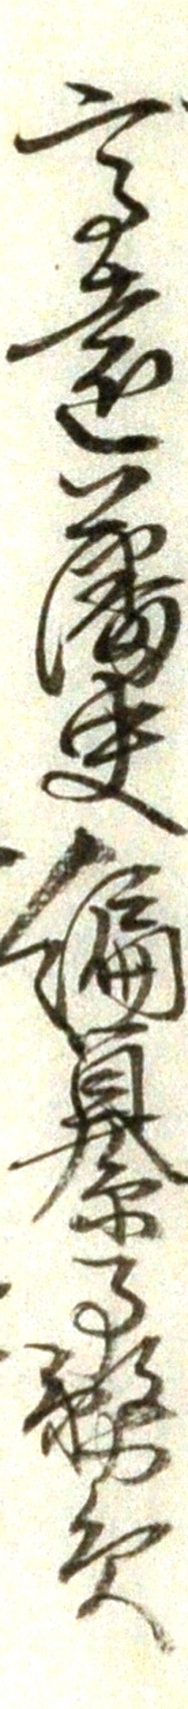高遠藩史編纂事務員
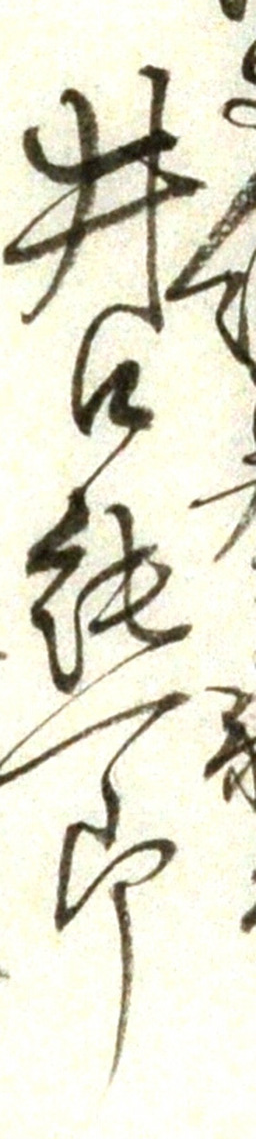井口純一郎

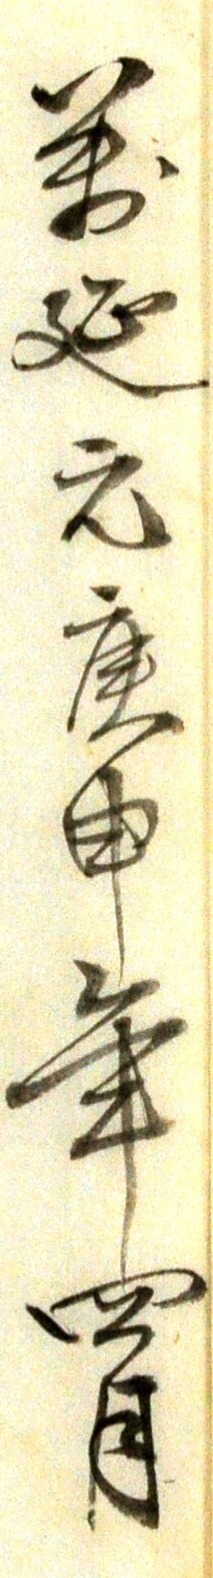万延元庚申年四月
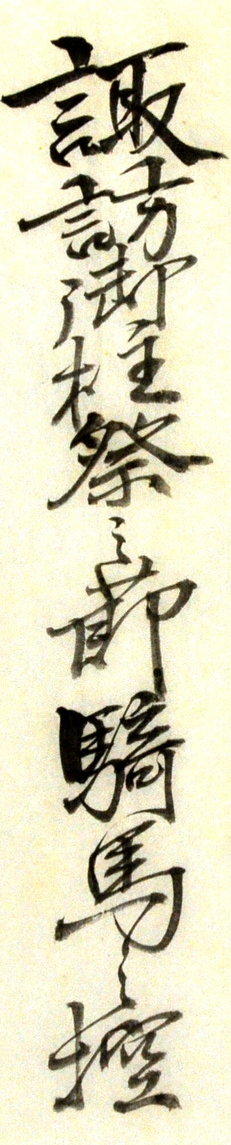諏訪御柱祭之節騎馬之控

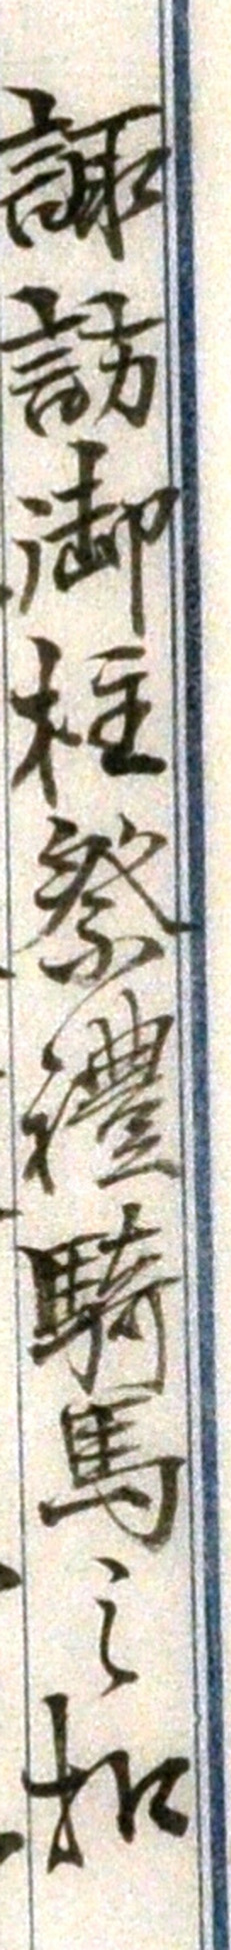諏訪御柱祭礼騎馬之控
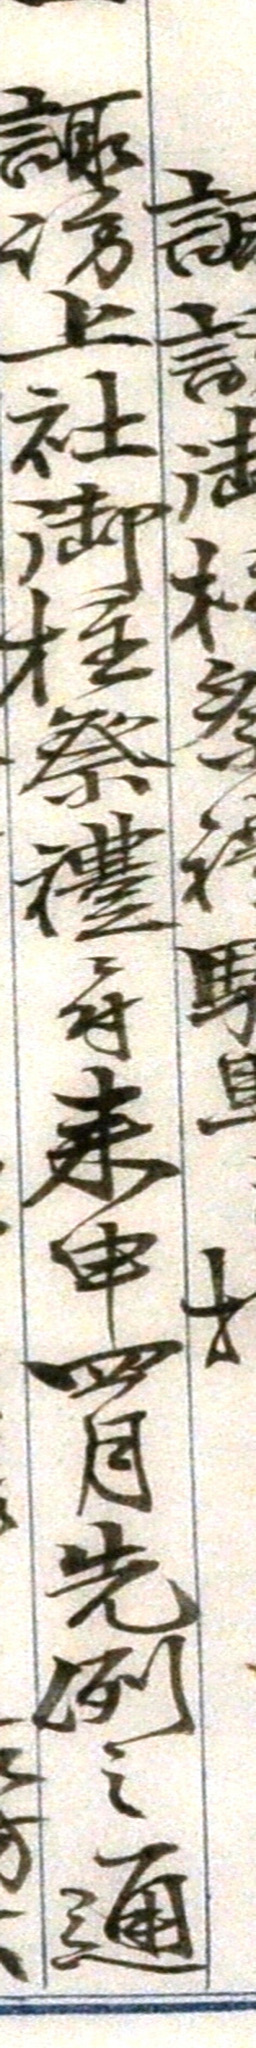一諏訪上社御柱祭礼ニ付来申四月先例之通
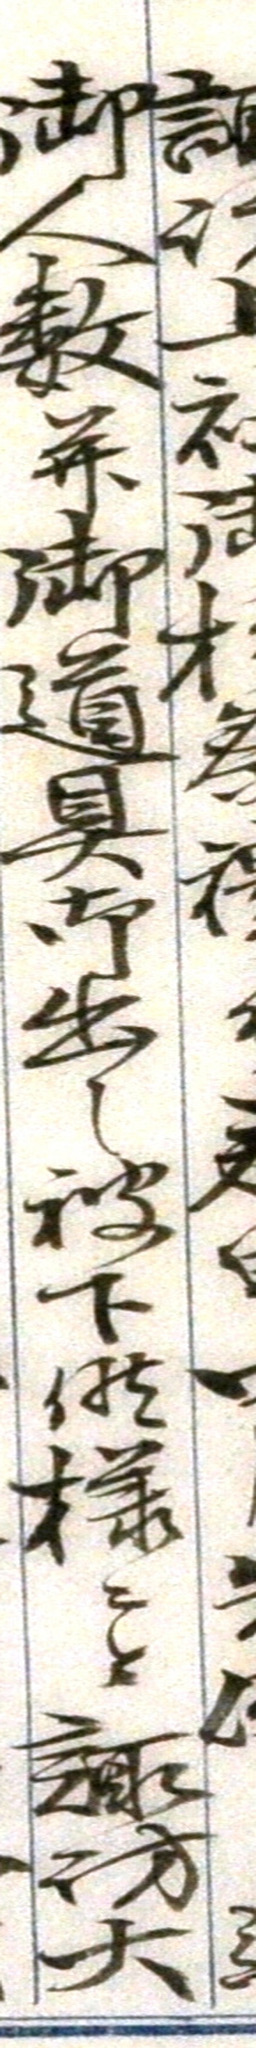御人数并御道具御出し被下候様ニと諏訪大
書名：諏訪御柱祭之節・騎馬大将御中間頭・御柱引人足
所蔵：伊那市立高遠町図書館・合同会社AMANE
